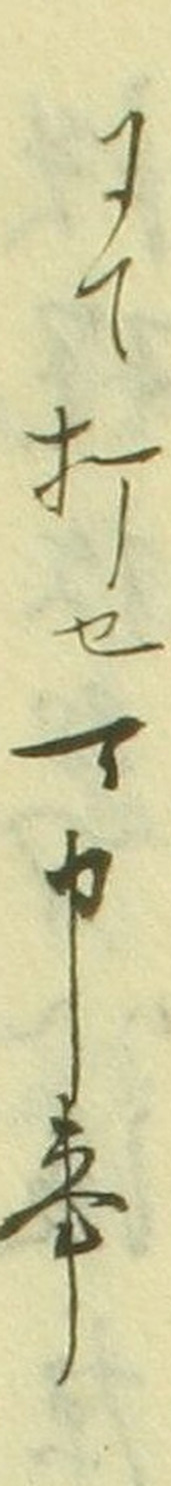にて打せ可申事
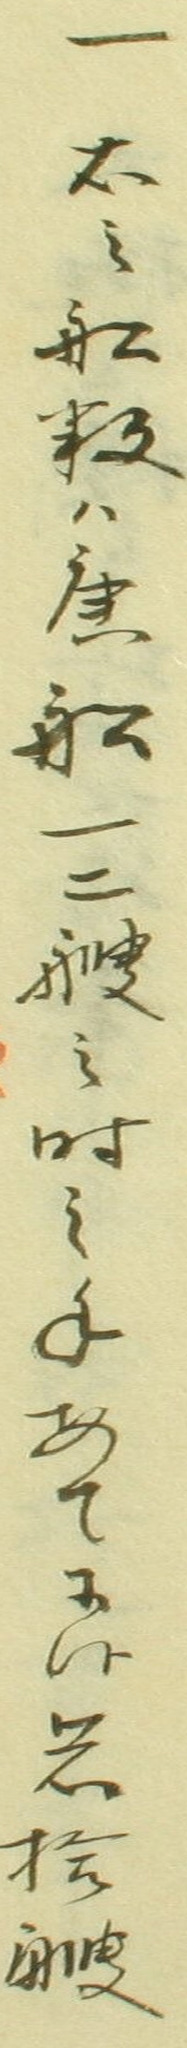一右之船数は唐船一二艘之時之手あてに候若拾艘
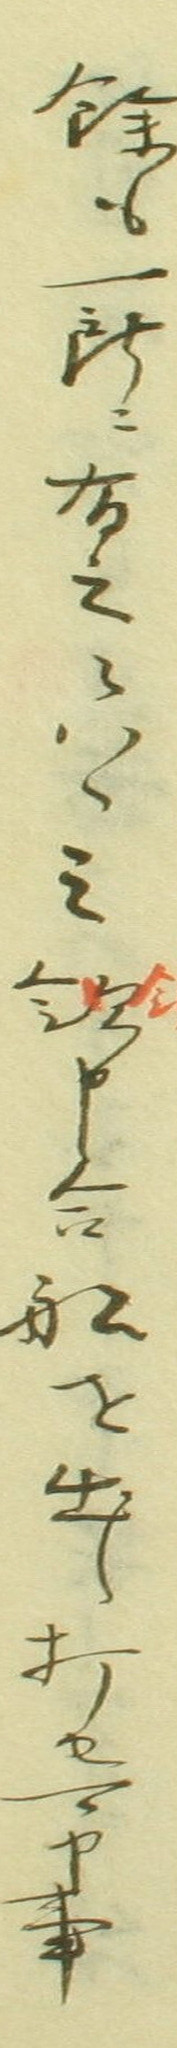余も一所ニ有之候はゝ三領申合船を出し打せ可申事
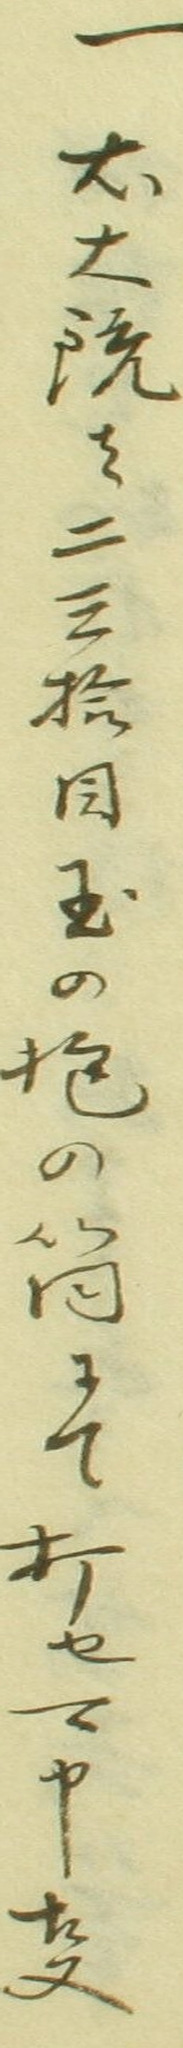一右大銃を二三拾目玉の抱の筒にて打せ可申叓
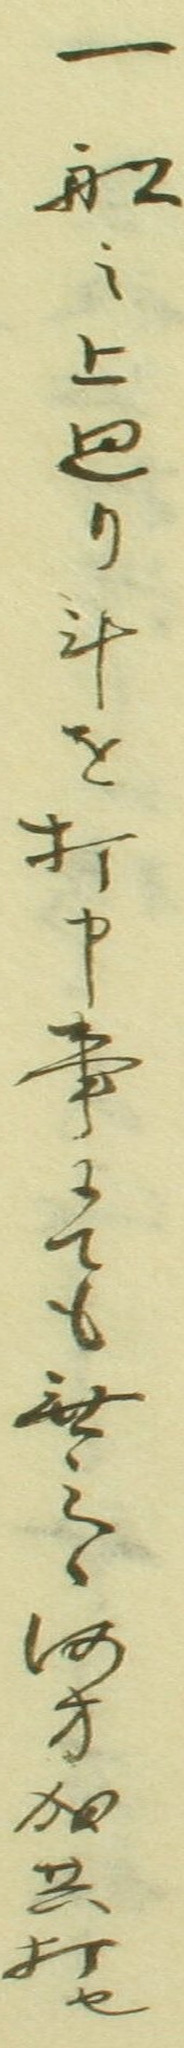一船之上廻り斗を打申事にても無之候何方成共打せ
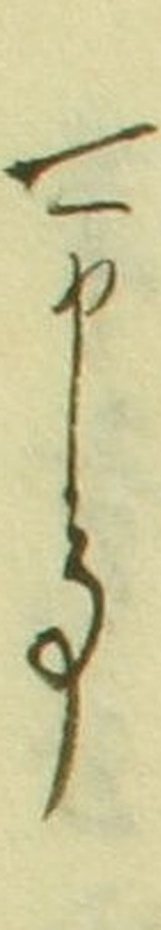可申事
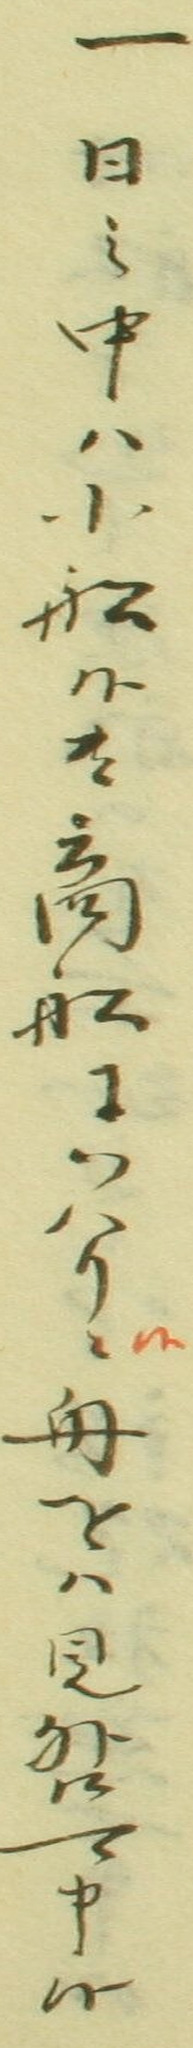一日之中は小船候共商船にかはり候舟をは見外に可申候
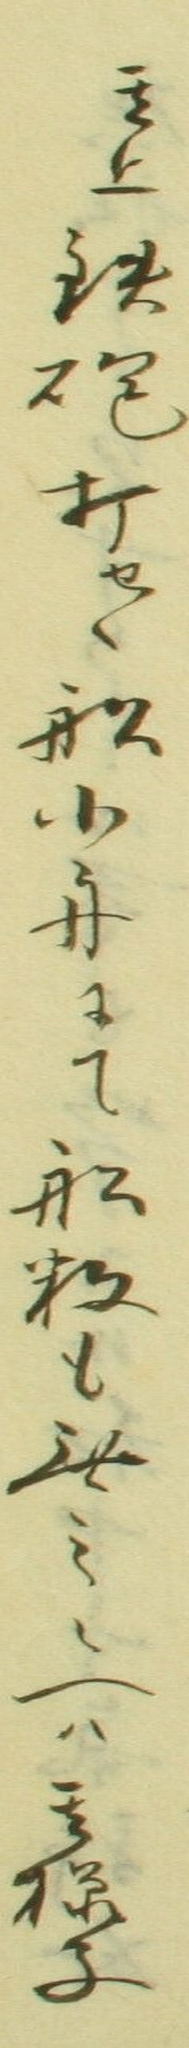其上鉄砲打せ候船小舟にて船数も無之候へは其様子

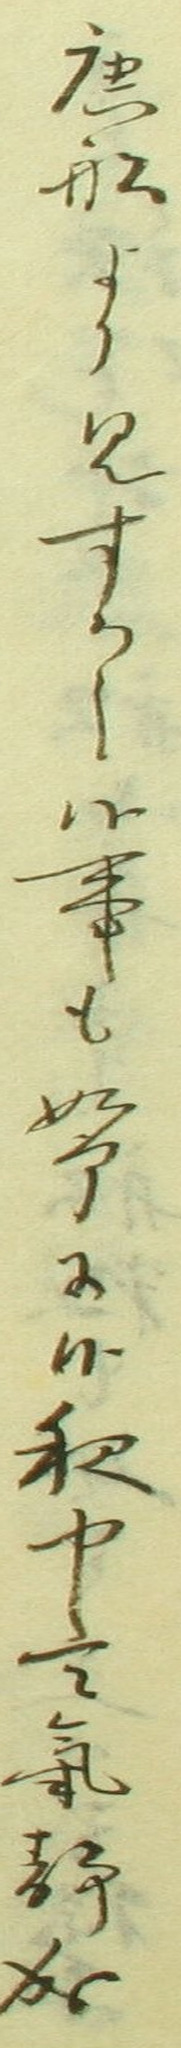唐船より見すかし候事も如何に候夜中天気静成
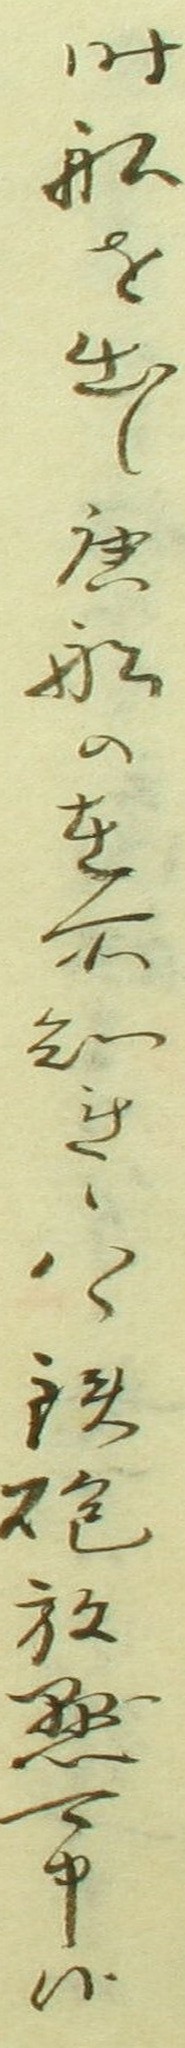時船を出し唐船の在所知れ候はゝ鉄砲放懸可申候
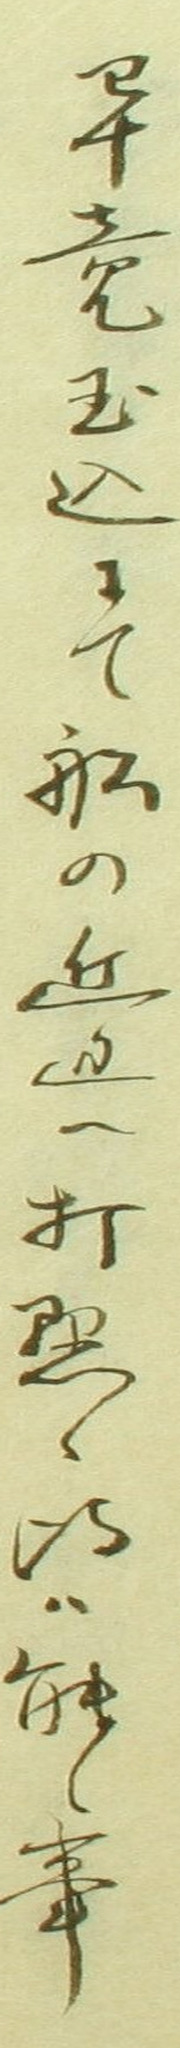畢竟玉込にて船の近辺へ打懸候得は能候事
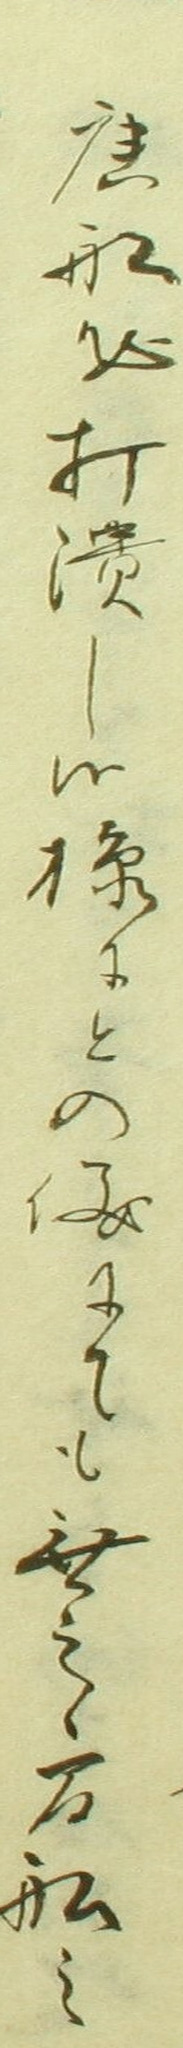一唐船必打潰し候様にとの儀にても無之候間船之
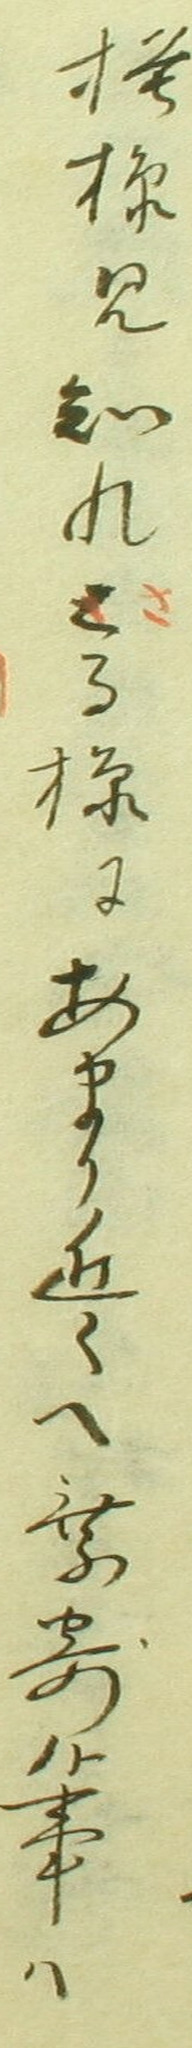模様見知れさる様にあまり近くへ乗寄候事は
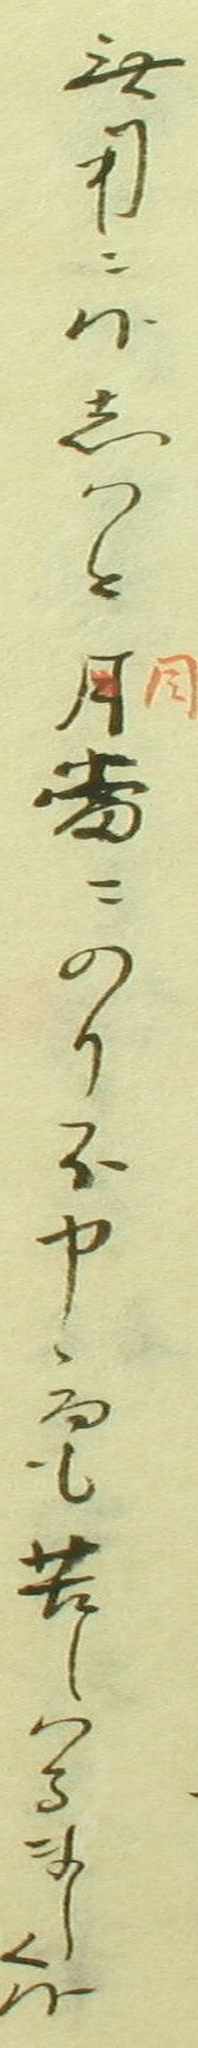無用ニ候しかと月番にのり不申候而も苦しかるましく候
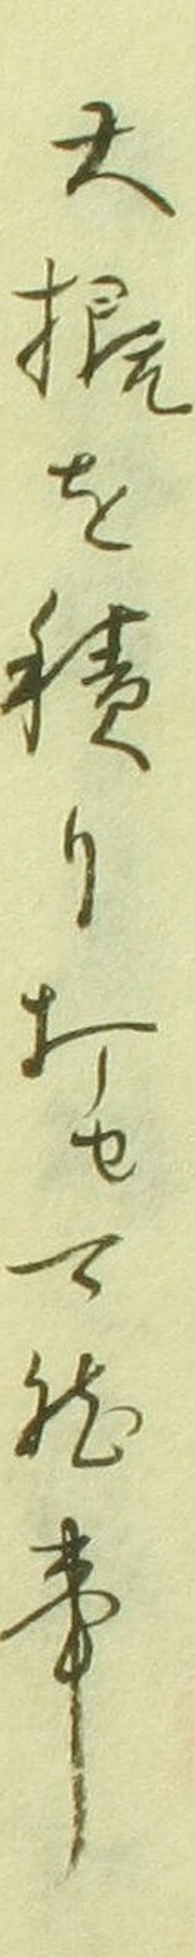大概を積り打せ可然事
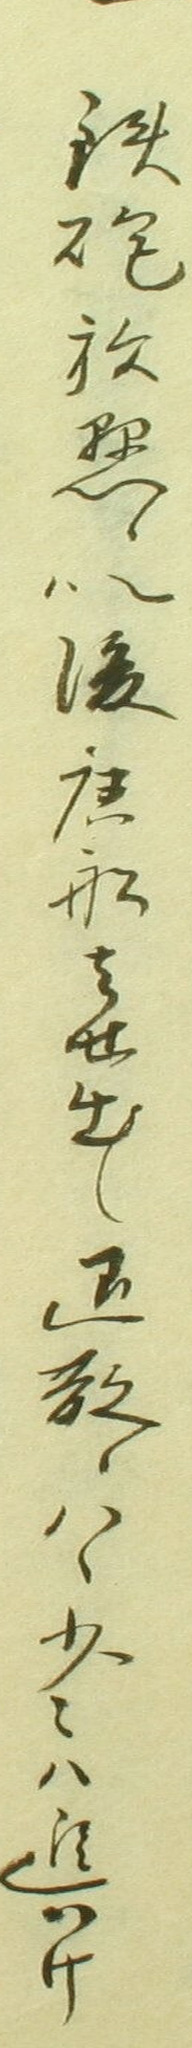一鉄砲放懸候以後唐船はせ出し退散候はゝ少々は追かけ
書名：唐船漂流記 二
